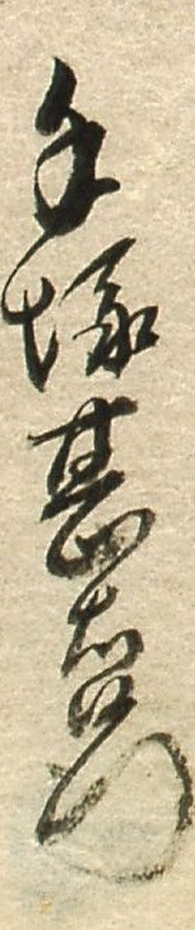手塚甚右衛門
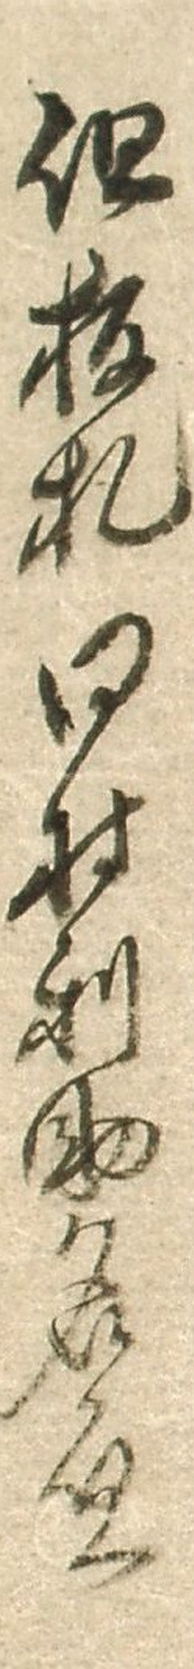但板札同村利助名
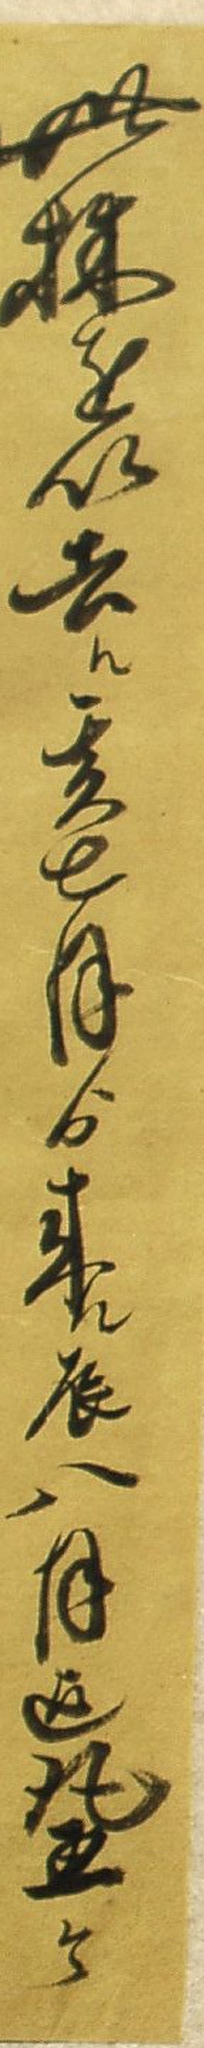此株を以去る亥七月より来る辰八月迄丸五ヶ
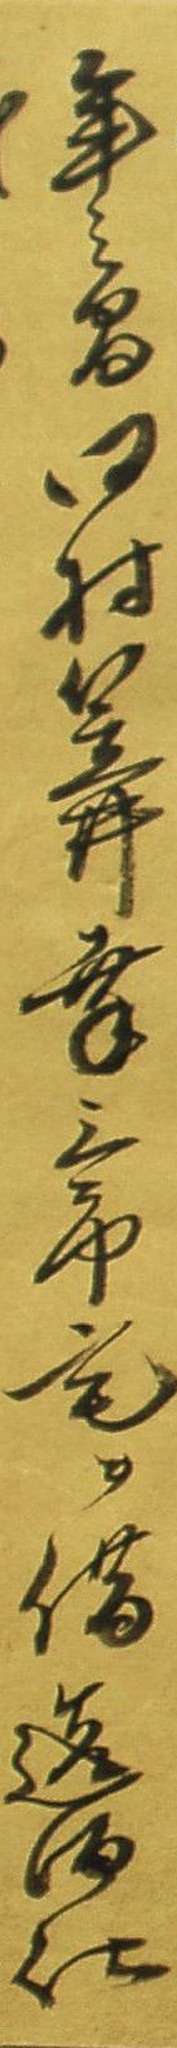年之間同村笠井幸三郎宅を借造酒仕
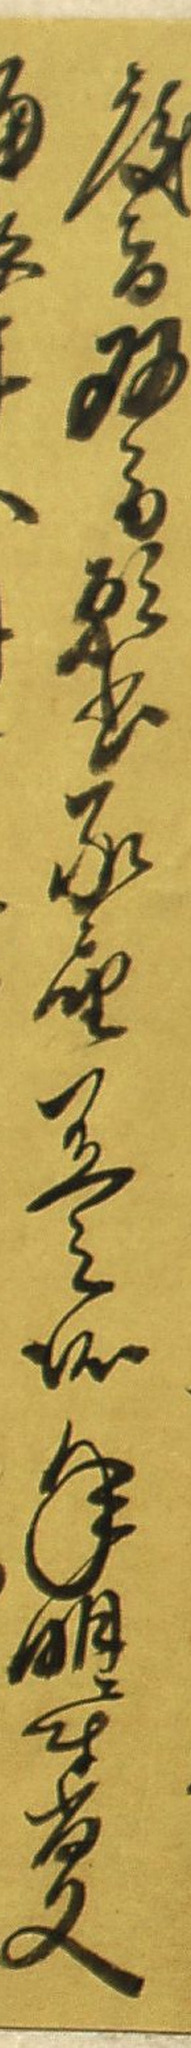度旨双方願出承届有之候所年明に付尚又
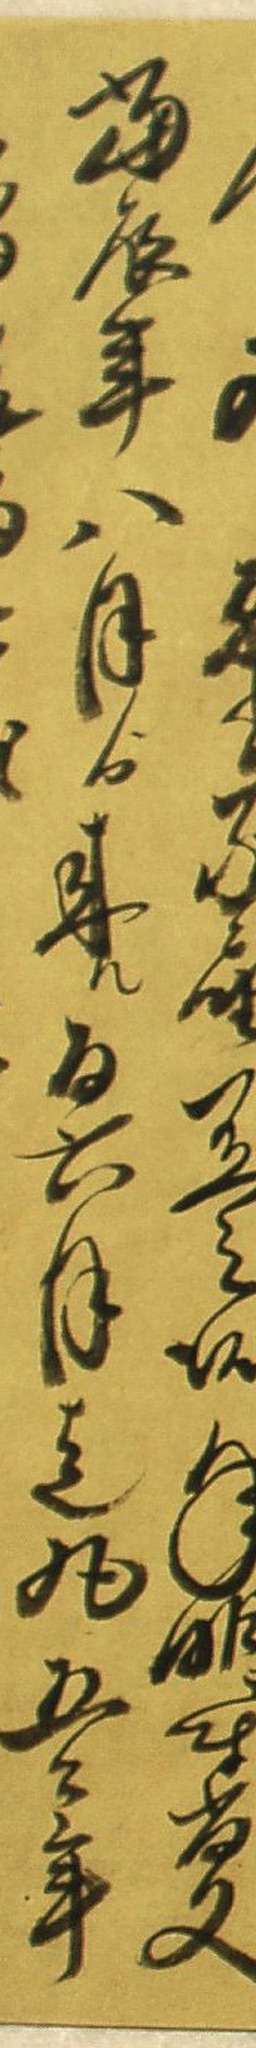当辰年八月より来る酉六月迄丸五ヶ年
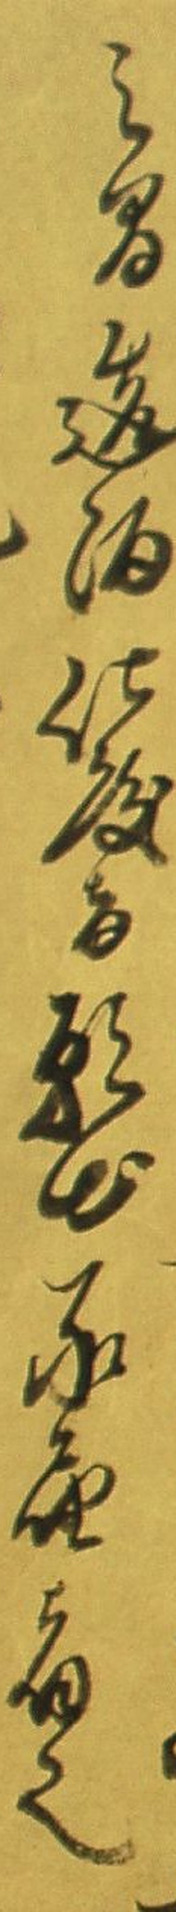之間造酒仕度旨願出承届者也
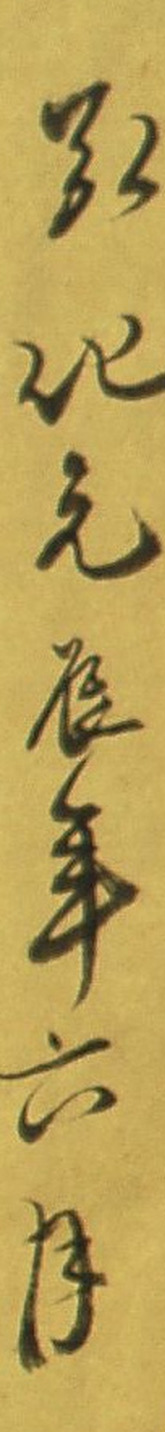弘化元辰年六月

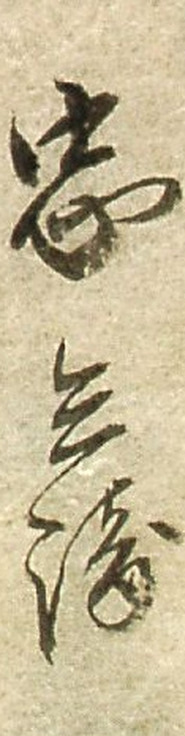忠兵衛
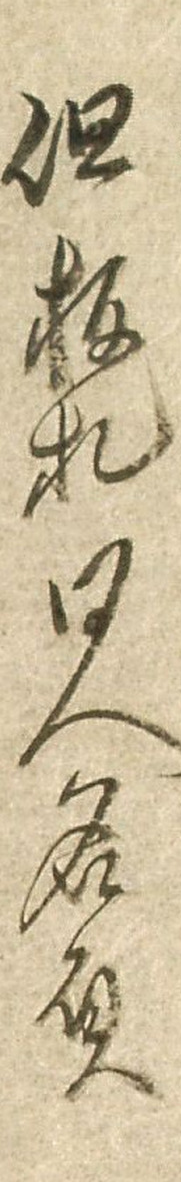但板札同人名
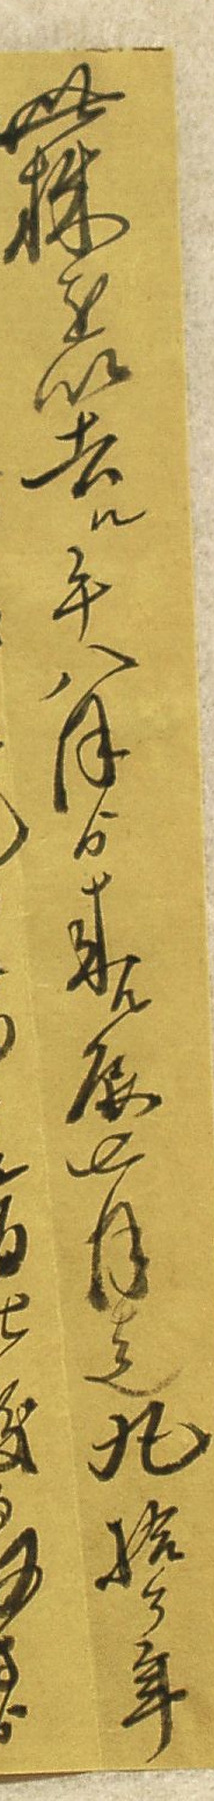此株を以去る午八月より来る辰七月迄丸十ヶ年
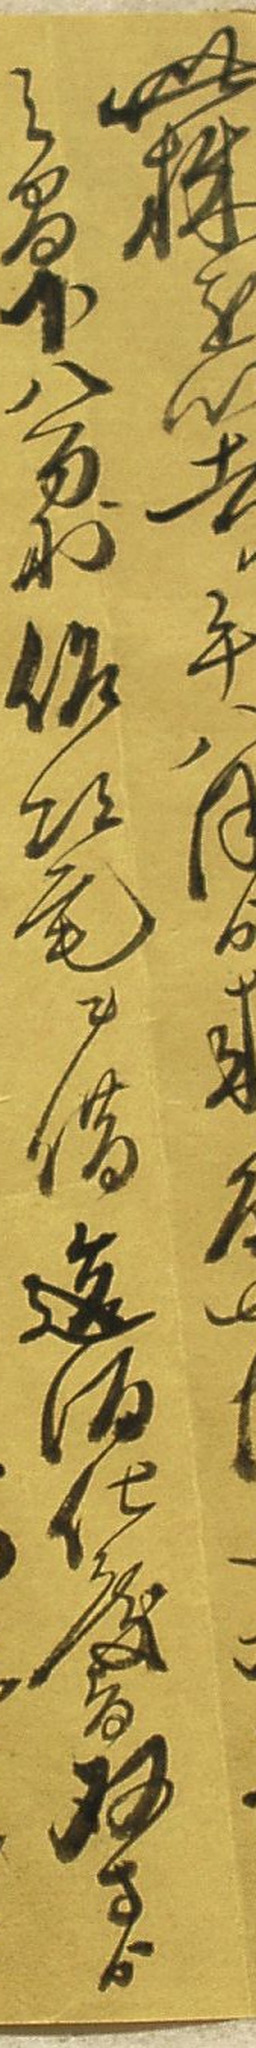之間下八万村作次宅を借造酒仕度旨双方より
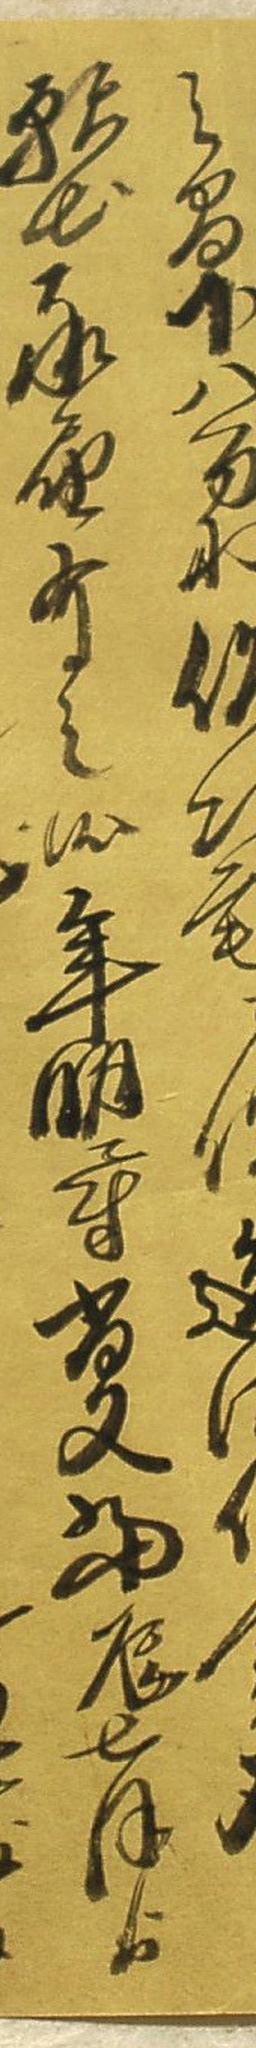願出承届有之候所年明に付尚又当辰年七月より
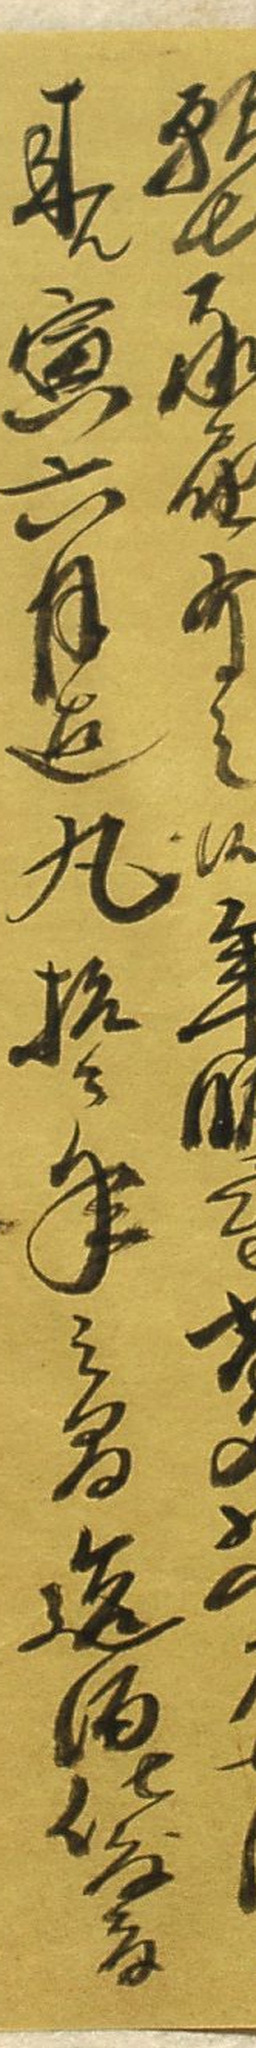来る寅六月迄丸十ヶ年之間造酒仕度旨
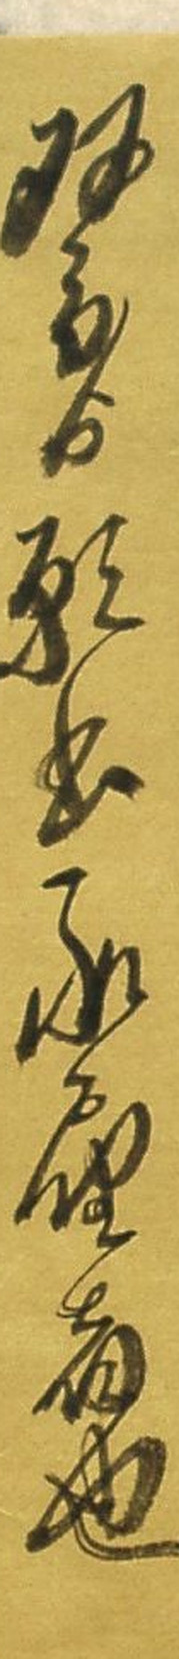双方より願出承届者也
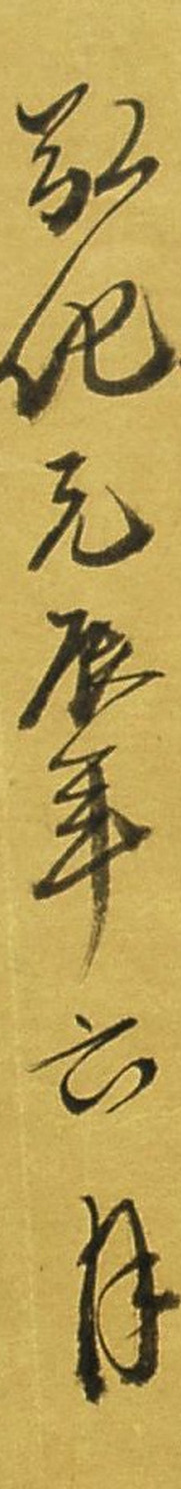弘化元辰年六月
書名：名東郡中酒株並造酒屋軒数取調帳
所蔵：鳴門教育大学 Naruto University of Education
